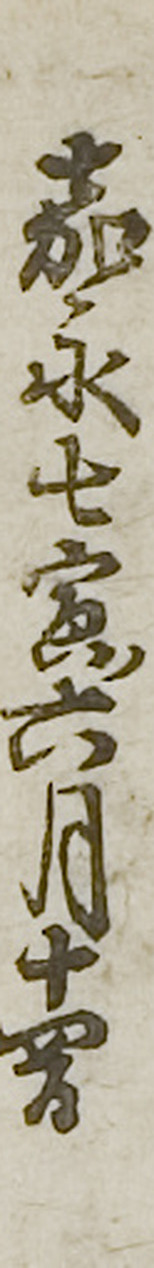嘉永七寅ノ六月十四日
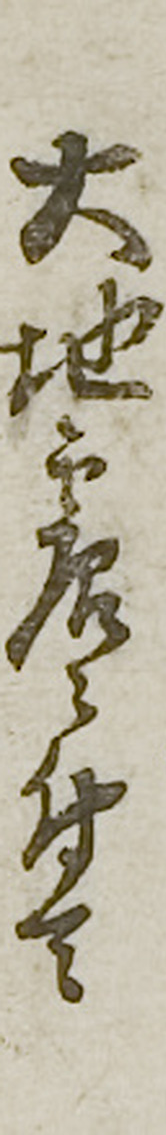大地震に付て
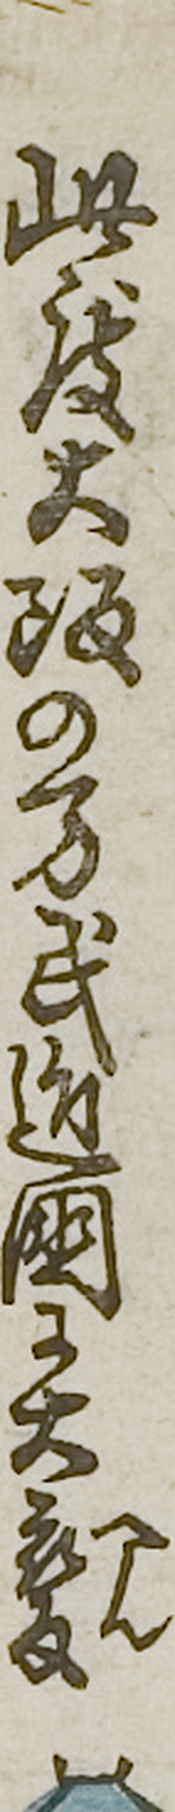此度大阪の万民近国に大変
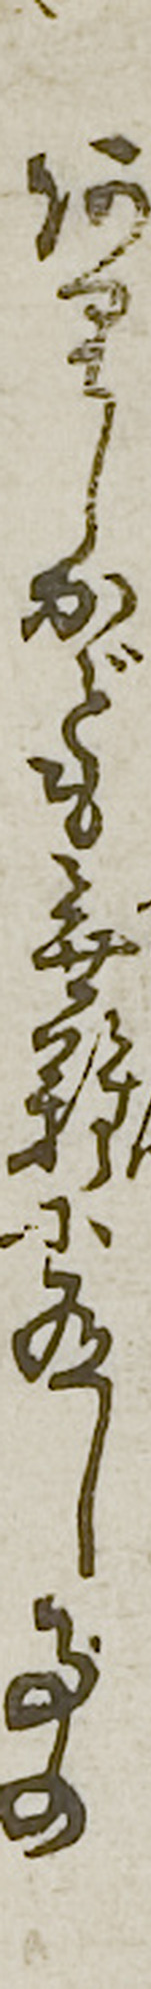ありしかども無難に有し事の
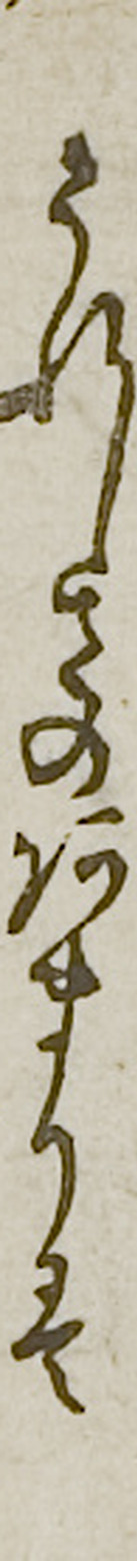うれしさのあまりにて
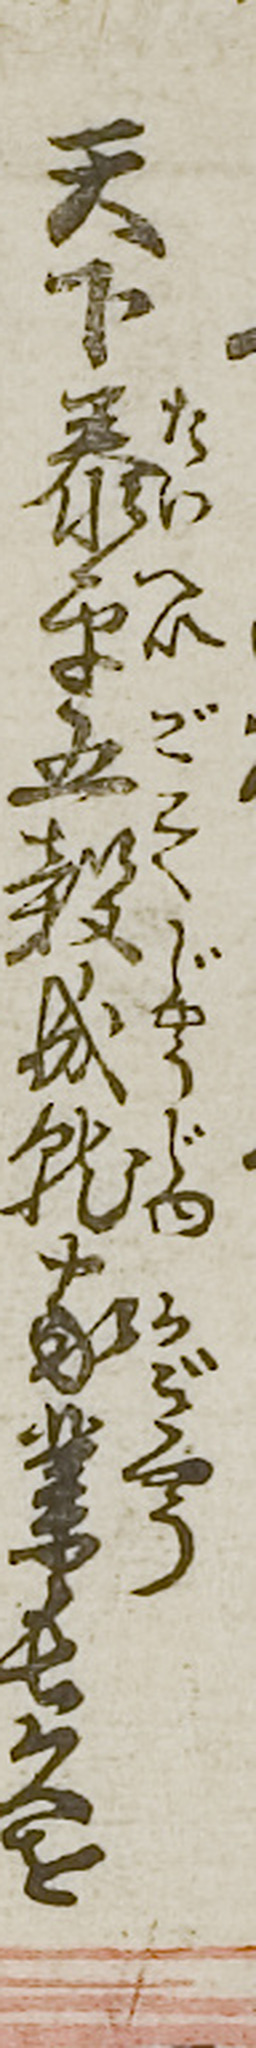天下泰平五穀成就家業長久を
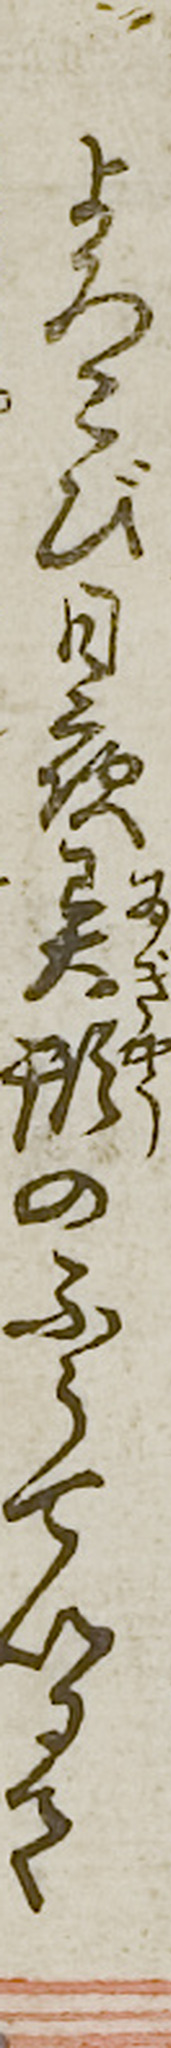よろこび日夜異形のふうていにて
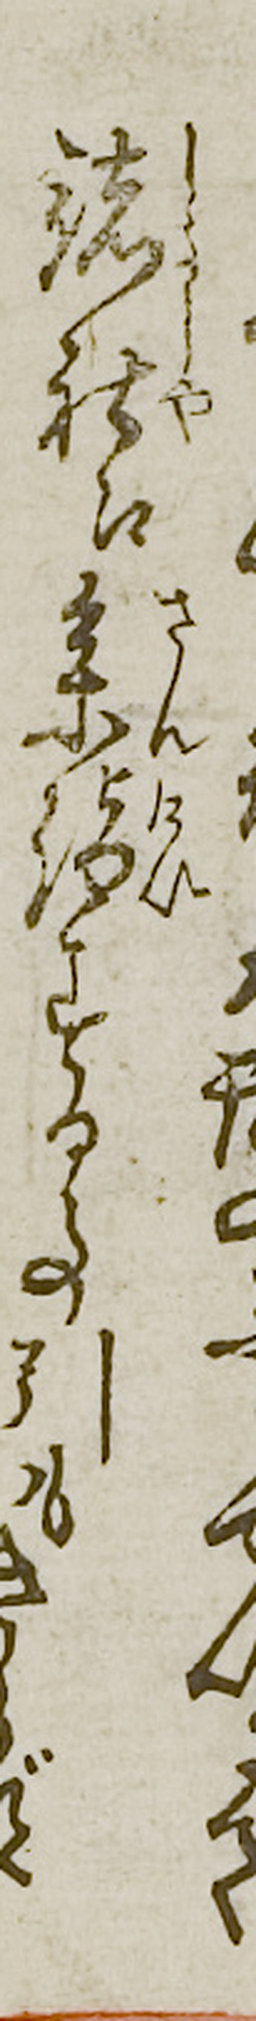諸社え参詣する事引きもきらず
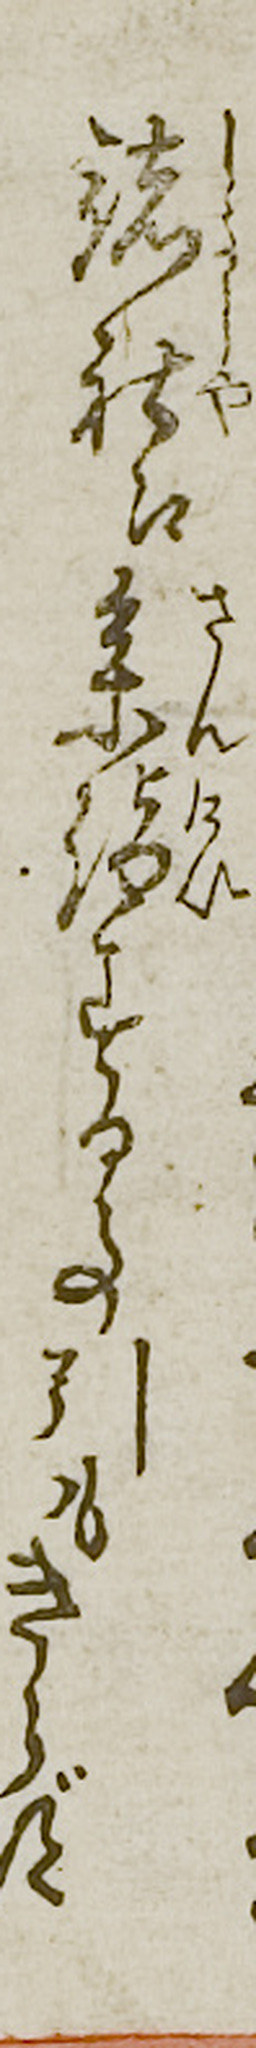諸社え参詣する事引きもきらず
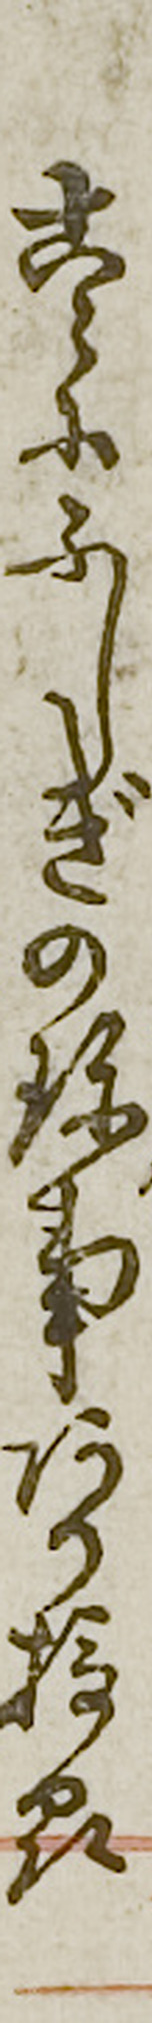こゝにふしぎの珍事あり摂州
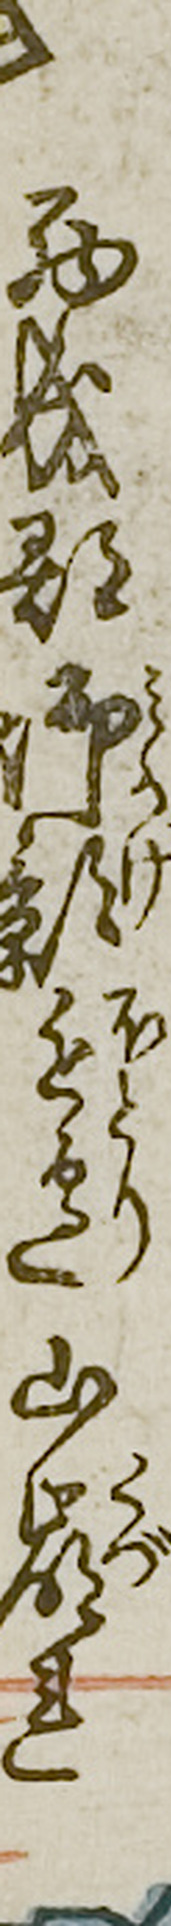西成郡御影近辺山崩れ
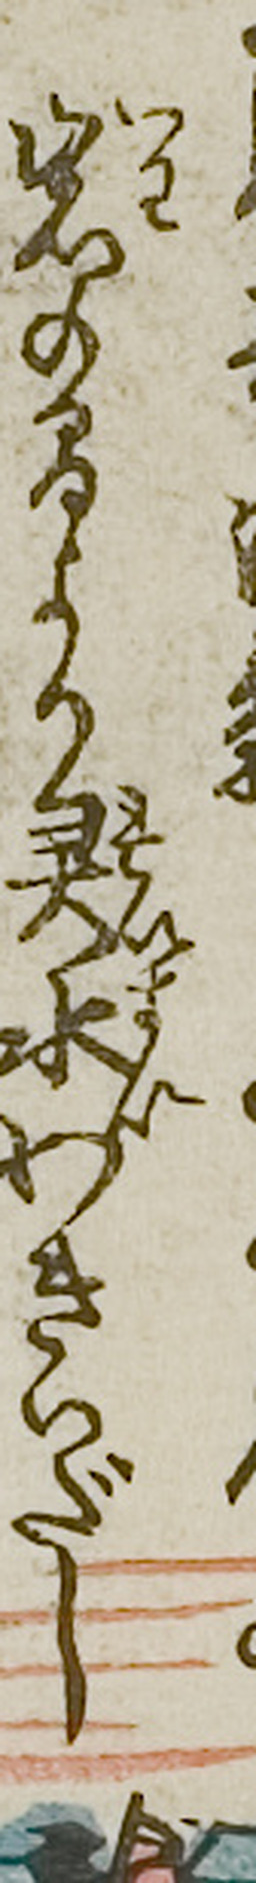岩の間より霊水わきいだし
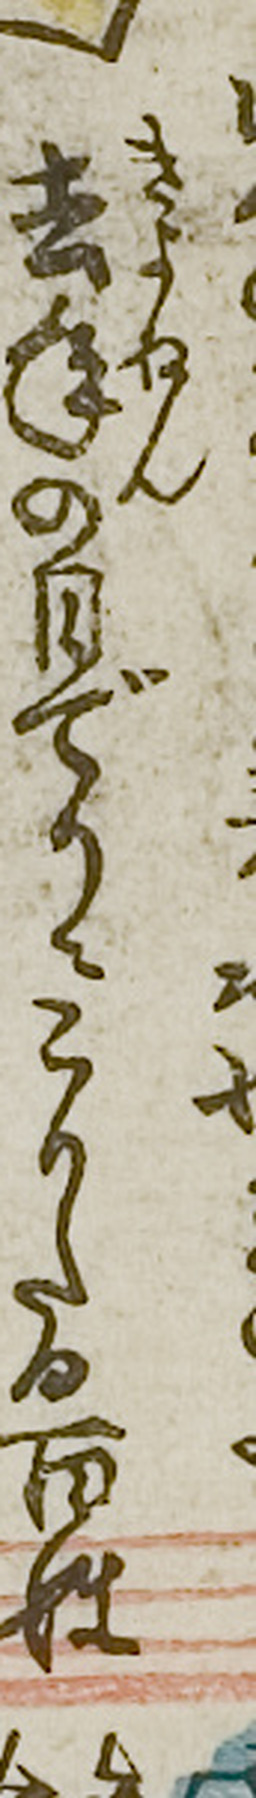去年の日でりにこりたる百姓
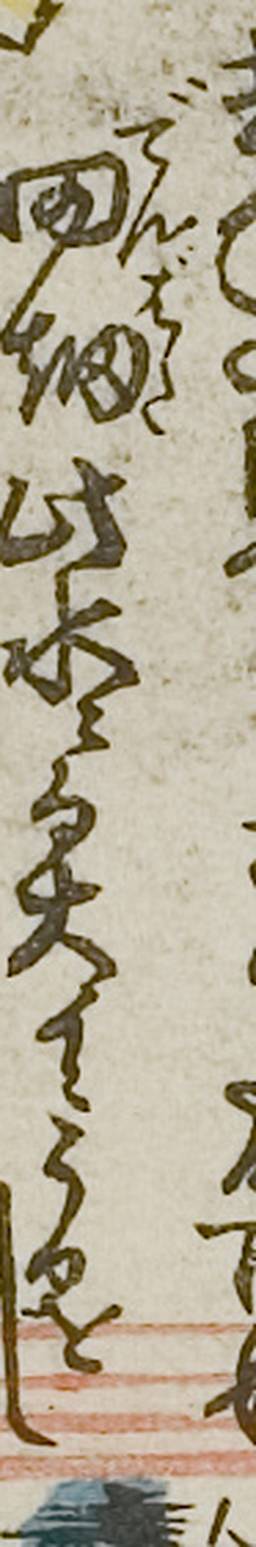田畑此水にて大いにうるをし
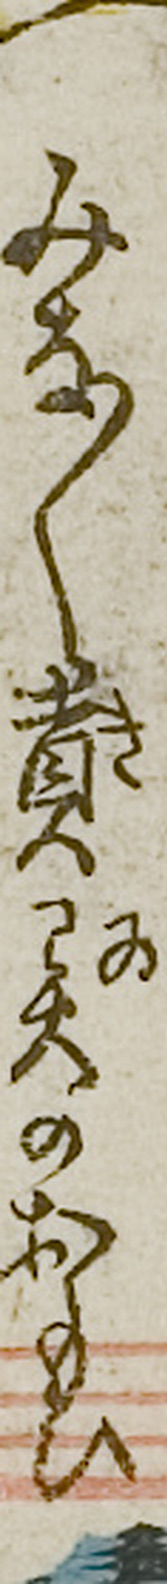みな〳〵貴異のおもひ
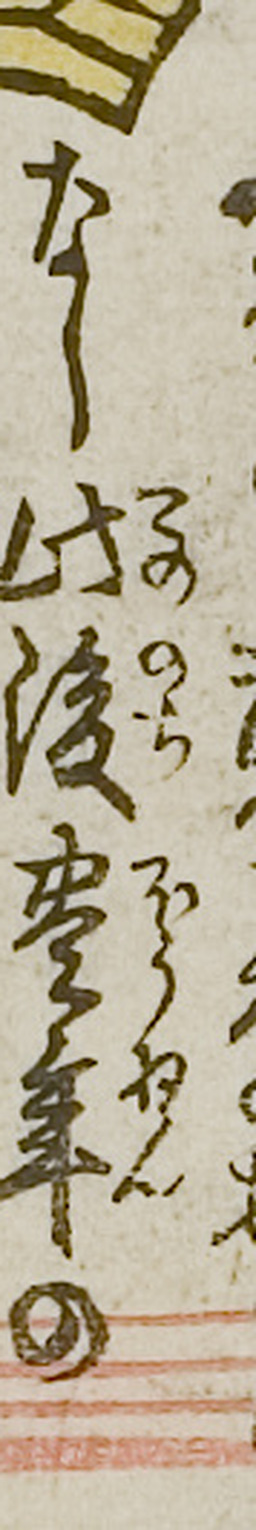なし此後豊年の
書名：嘉永七年之寅ノ六月十四日大地震ニ付て
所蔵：東京大学総合図書館 General Library in the University of Tokyo, JAPAN
